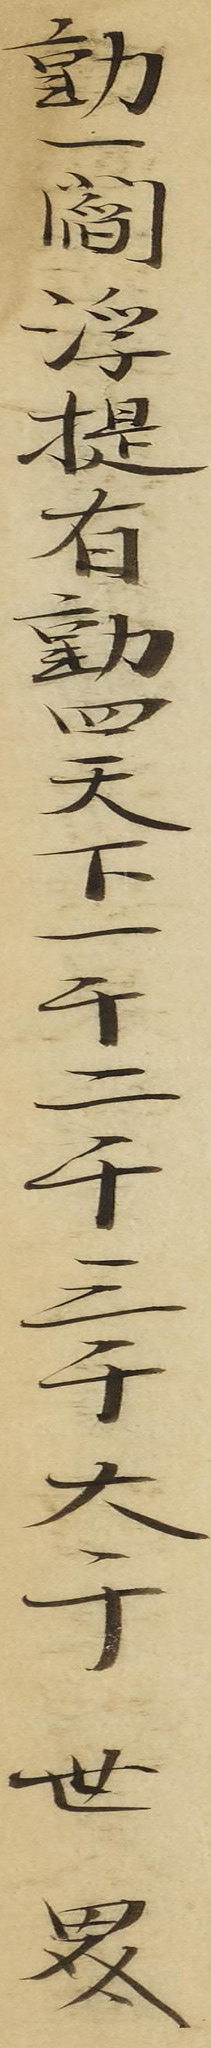動一閻浮提有動四天下一千ニ千三千大千世界

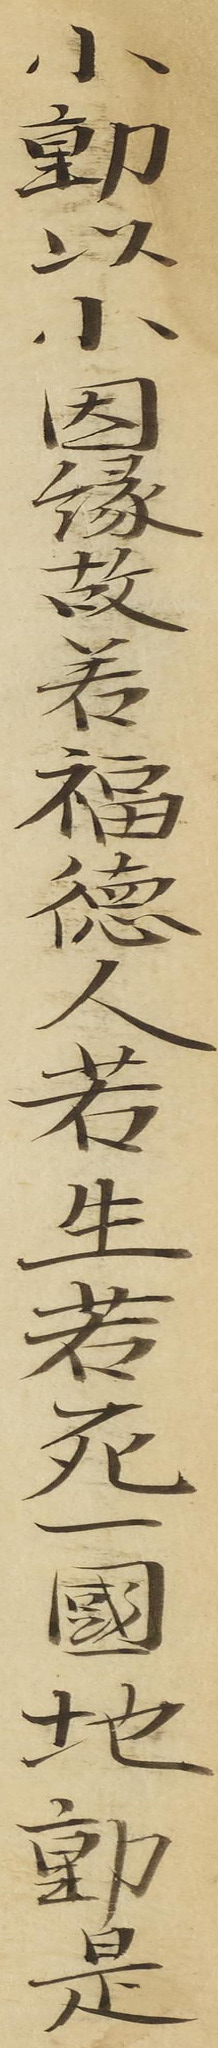小動以小因縁故若福徳人若生若死一国地動是
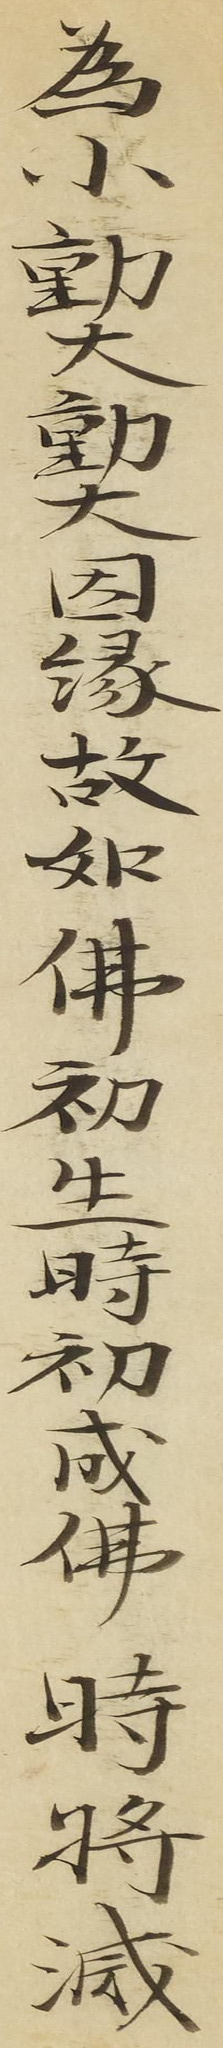為小動大動大因縁故如仏初生時初成仏時将滅
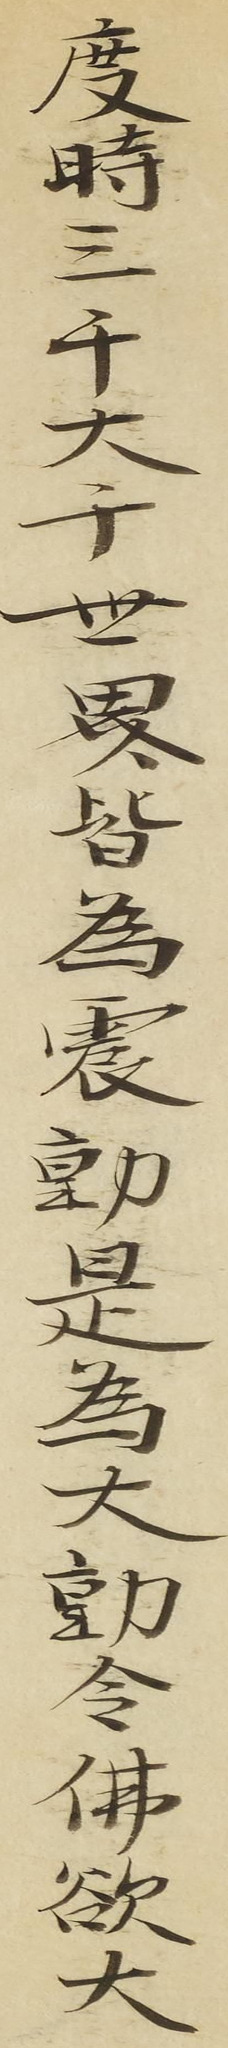度時三千大千世界皆為震動是為大動令仏欲大
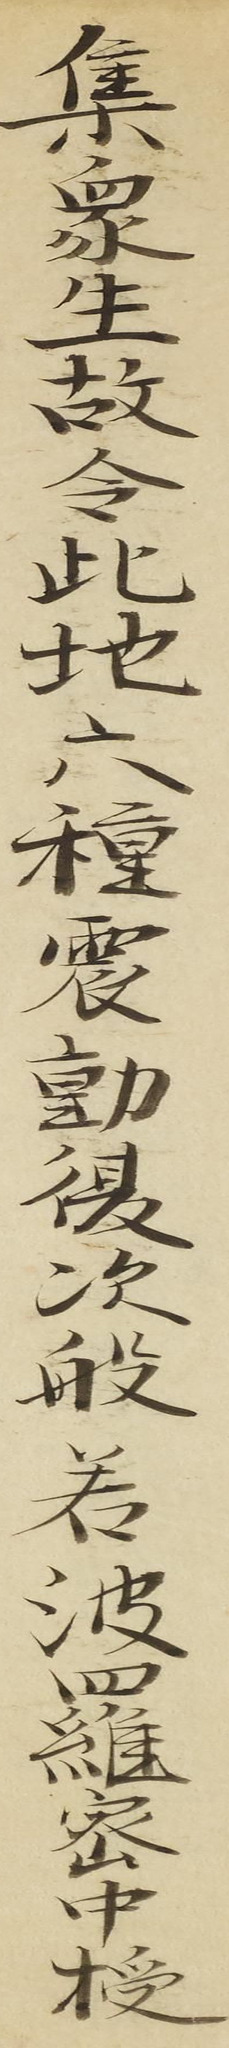集衆生故令此地六種震動復次般若波羅密中授
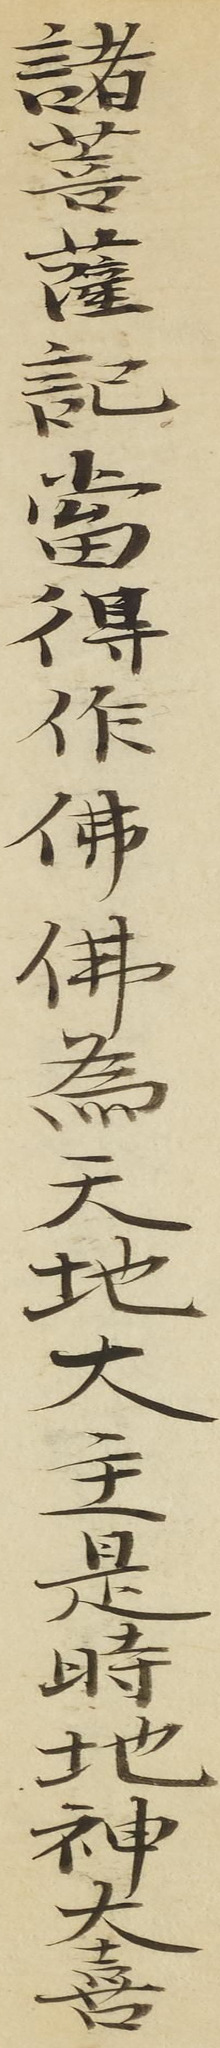諸菩薩記当得作仏仏為天地大主是時地神大喜
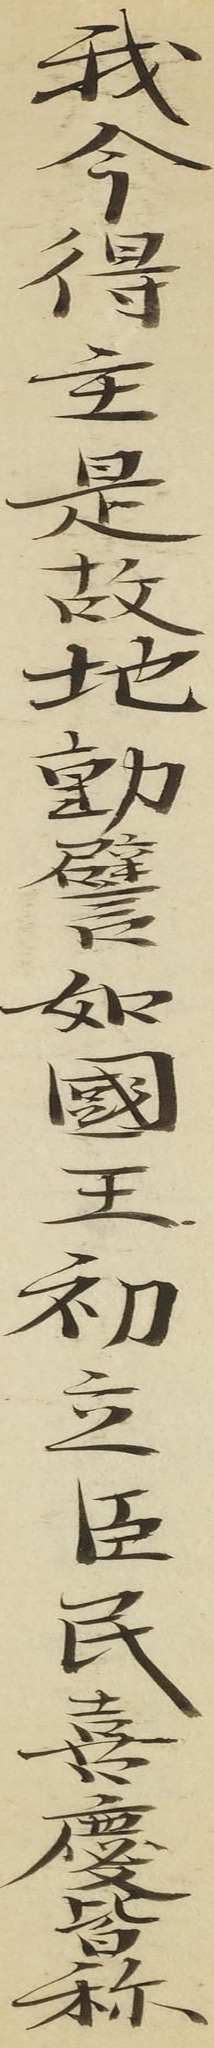我今得主是故地動譬如国王初立臣民喜慶皆称
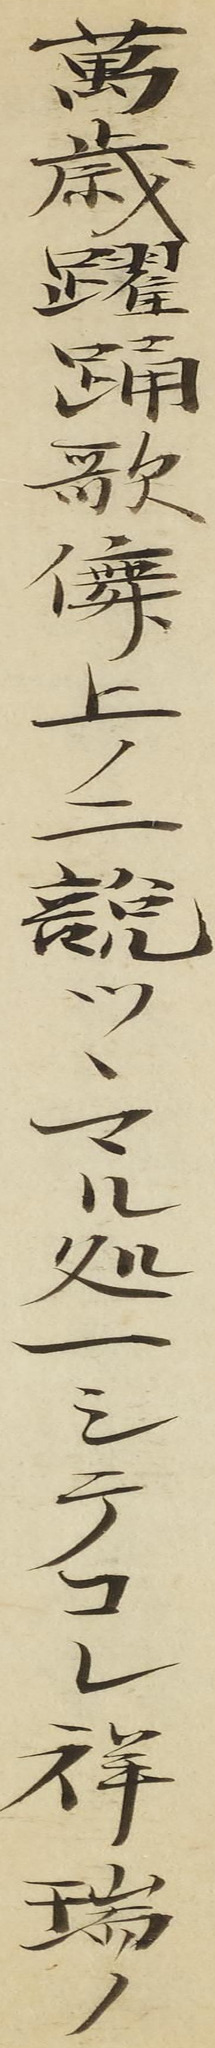万歳躍踊歌儛上ノニ説ツヽマル処一シテコレ祥瑞ノ
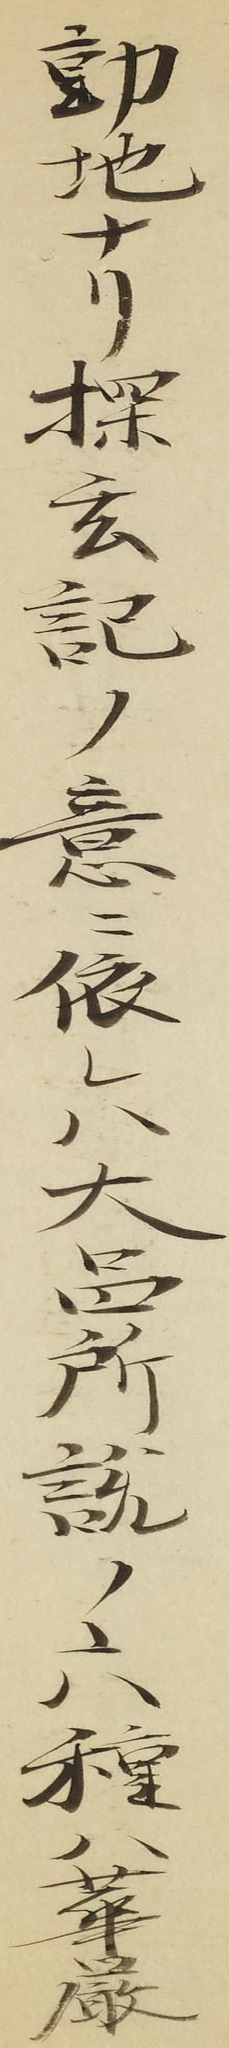動地ナリ探玄記ノ意ニ依レハ大品所説ノ六種ハ華厳
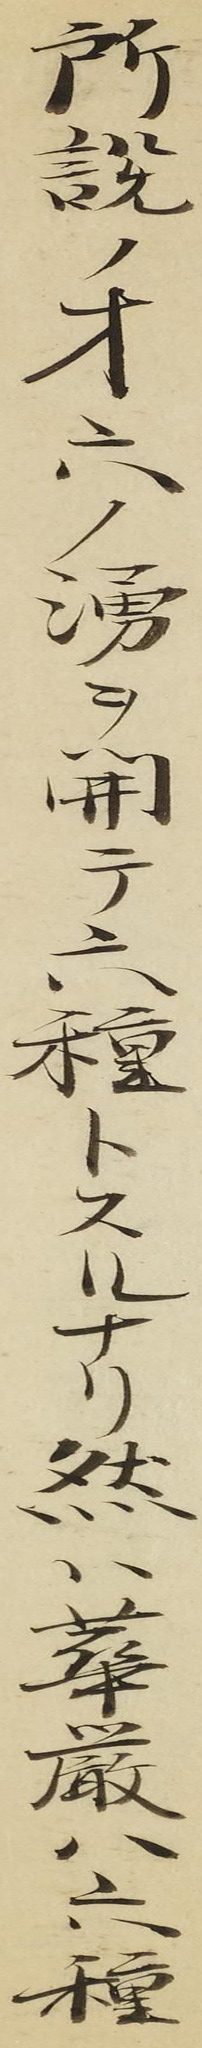所説ノ第六ノ湧ヲ開テ六種トスルナリ然ハ華厳ハ六種
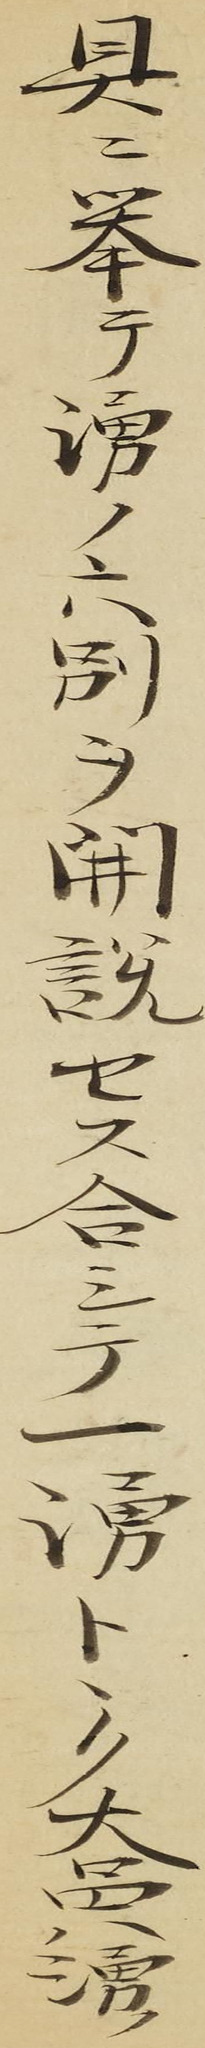具ニ挙テ湧ノ六別ヲ開説セス合シテ一湧トヽク大品ハ湧ノ
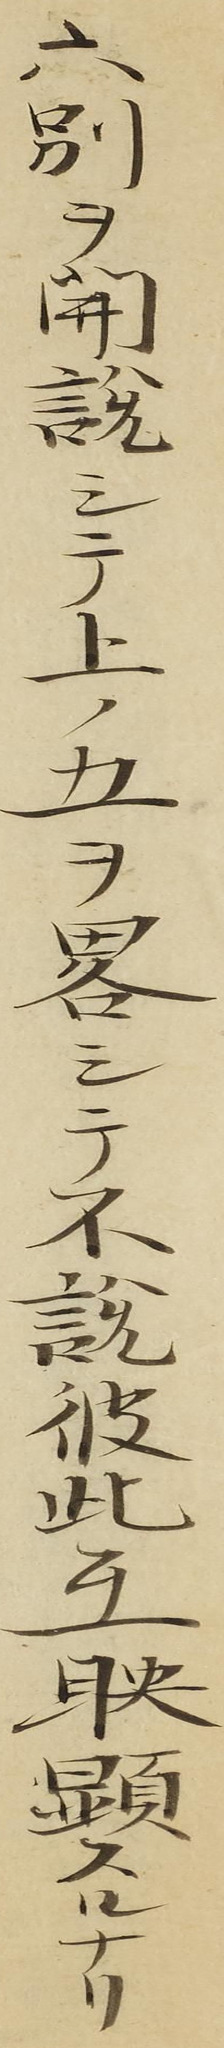六別ヲ開説シテ上ノ五ヲ略シテ不説彼此互映顕スルナリ
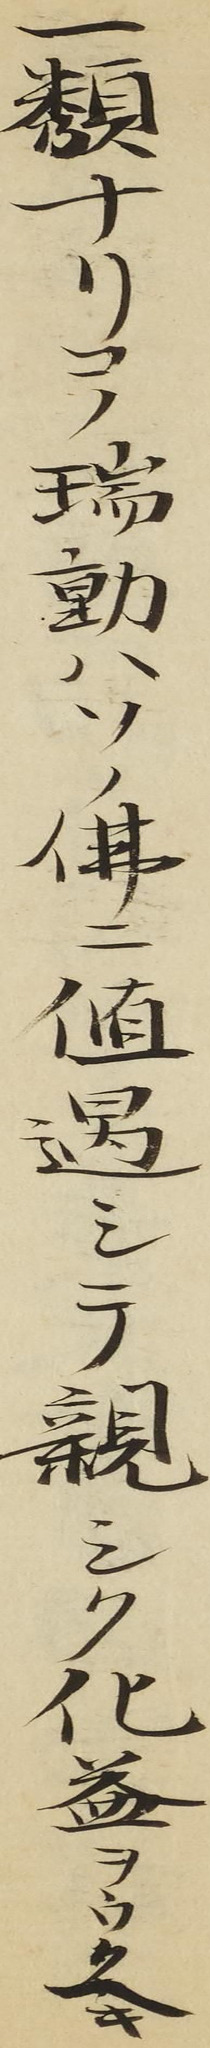一類ナリコノ瑞動ハソノ仏ニ値遇シテ親シク化益ヲウクヘキ
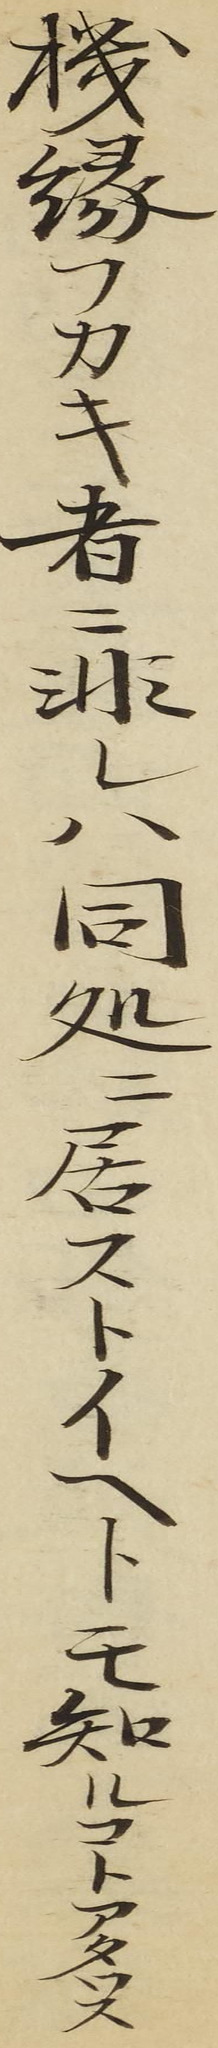機縁フカキ者ニ非レハ同処ニ居ストイヘトモ知ルコトアタワス
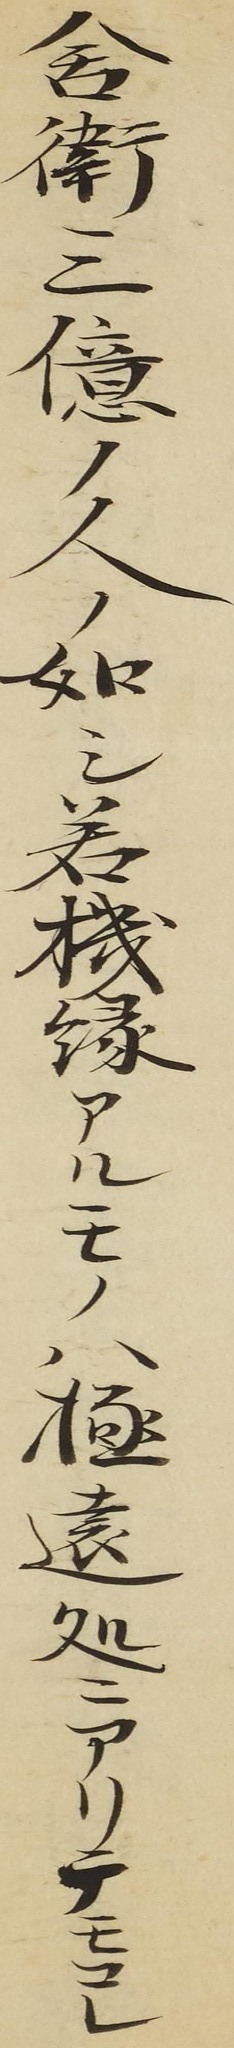舎衛三億ノ人ノ如シ若機縁アルモノハ極遠処ニアリテモコレ
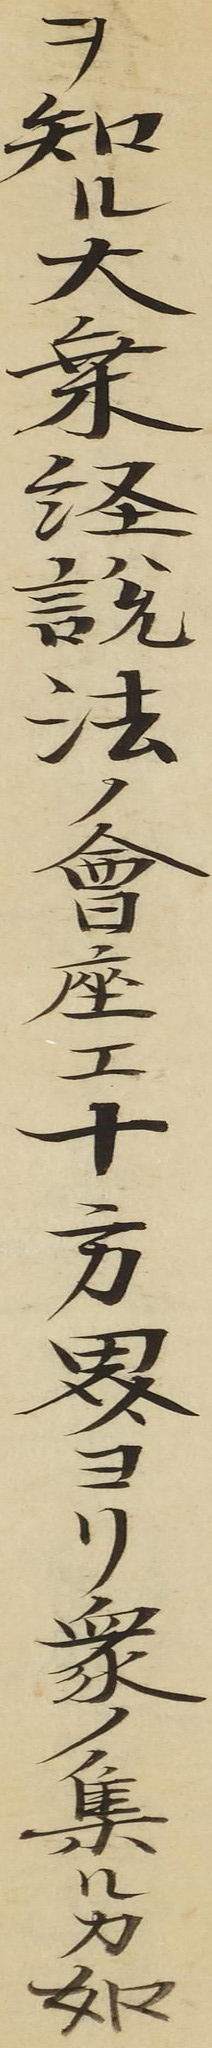ヲ知ル大乗経説法ノ会座エ十方界ヨリ衆ノ集ルカ如
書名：地震説　鶴高山善仁寺天柗老人著述　全
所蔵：東京大学地震研究所図書室 Earthquake Research Institute Library, The University of Tokyo, JAPAN
